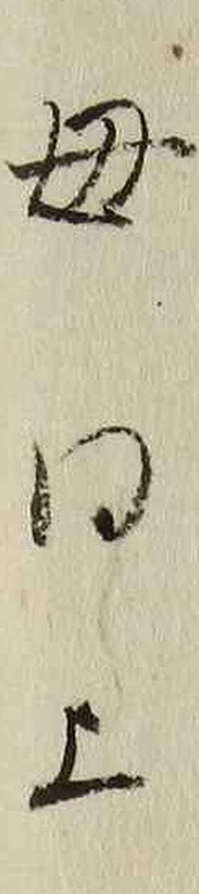母同上
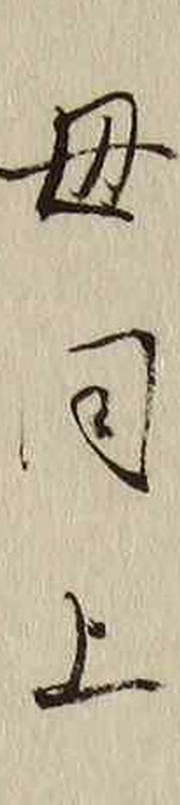母同上
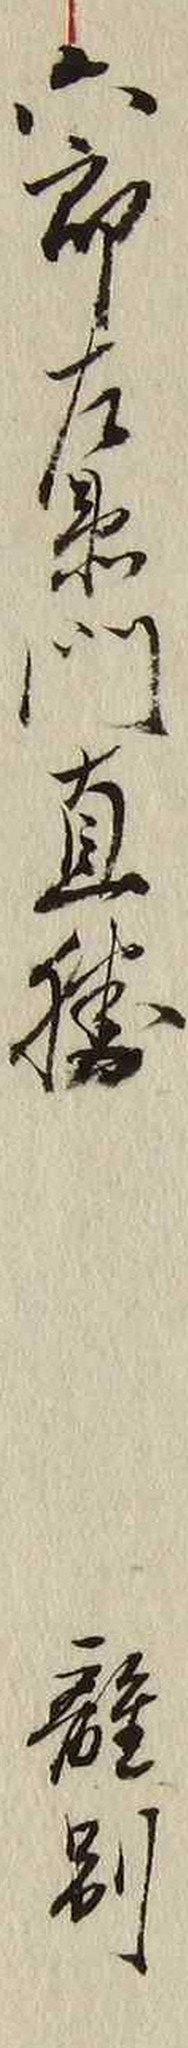六郎左衛門直勝離別
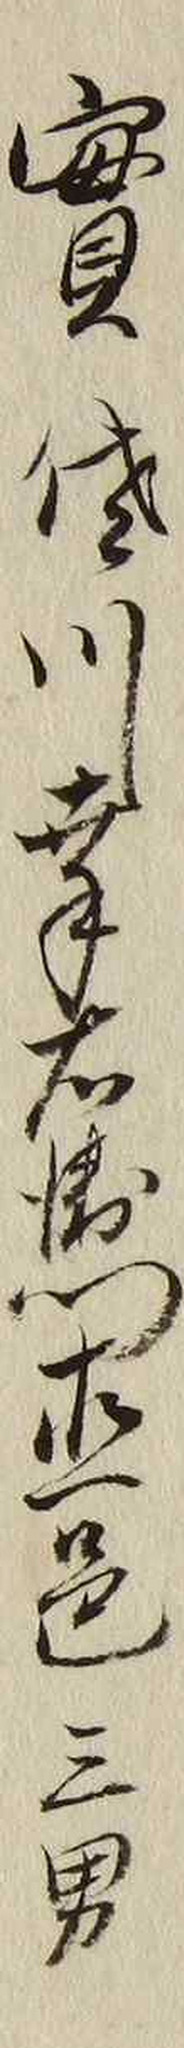実佐川幸右衛門直邑三男
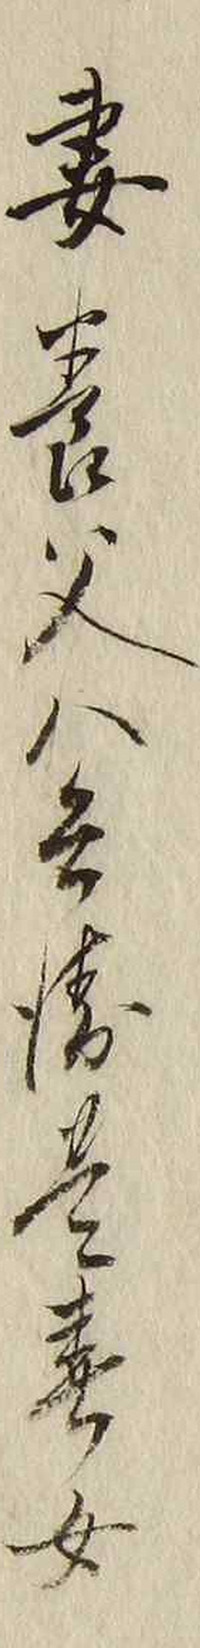妻養父八兵衛是春女

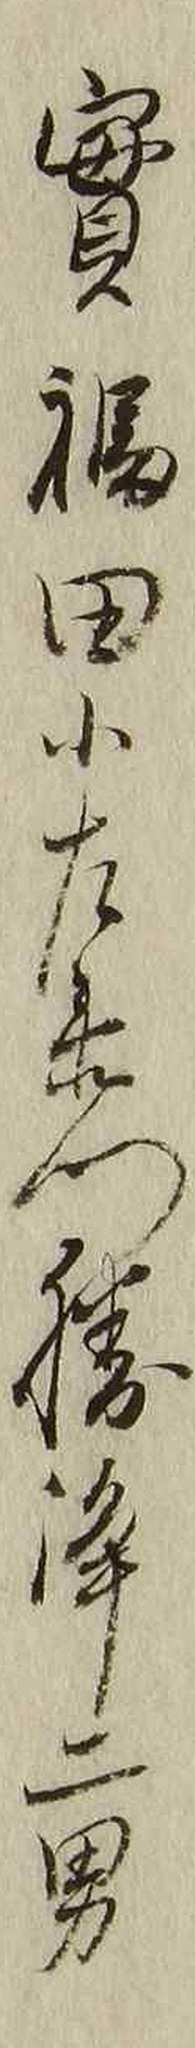実福田小左衛門勝浄二男
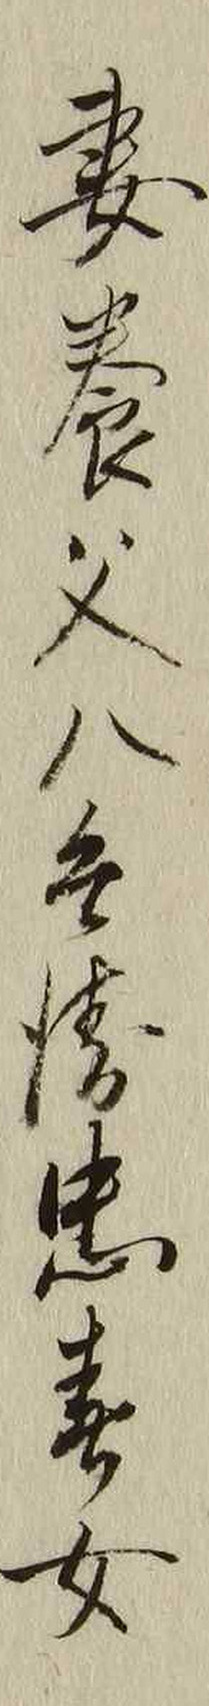妻養父八兵衛忠春女
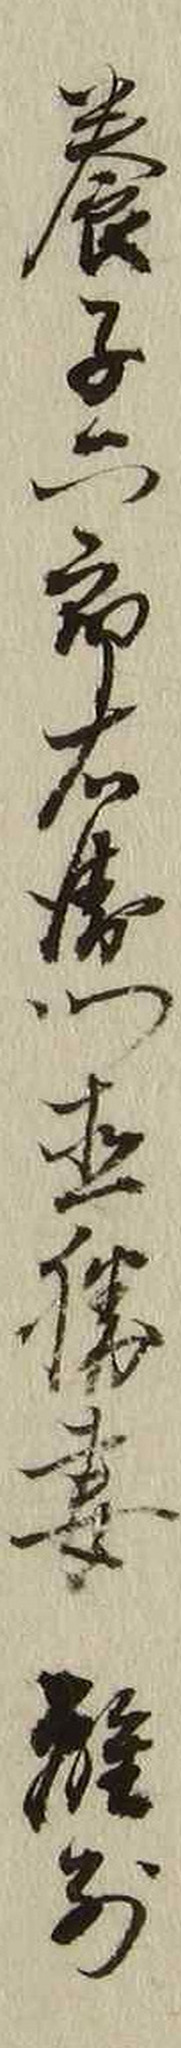女養子六郎右衛門直勝妻離別
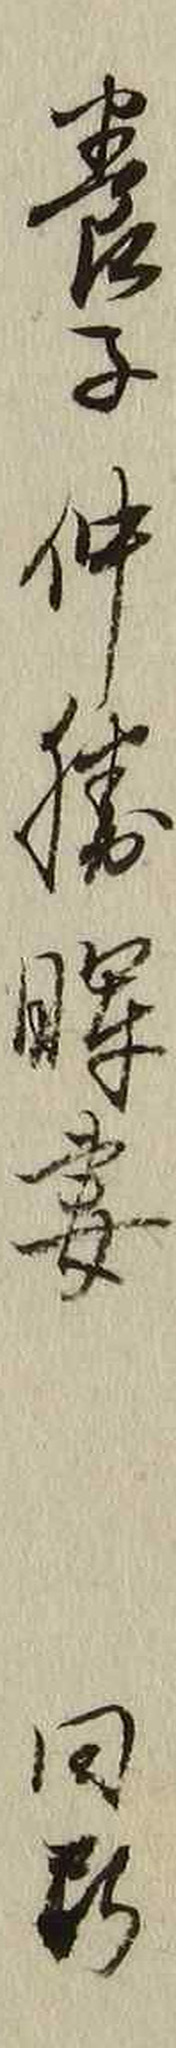養子仲勝暉妻同断
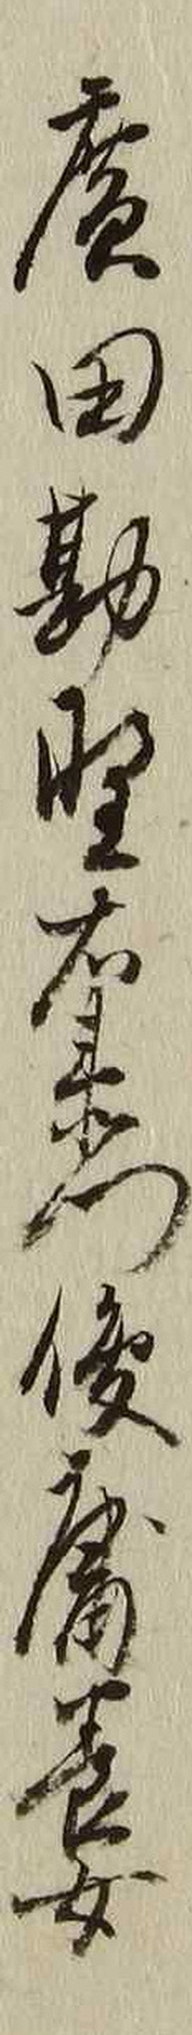広田勘野右衛門俊庸養女
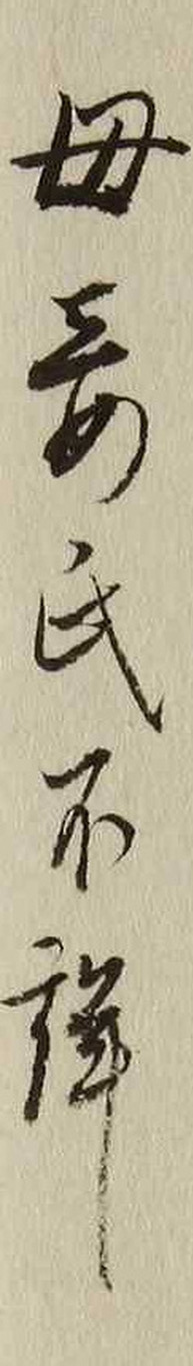母妻氏不詳
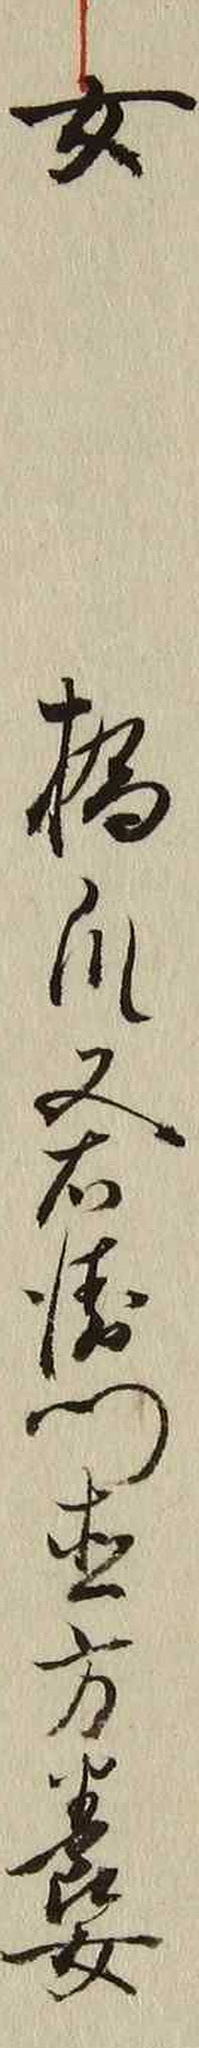女橋瓜又右衛門直方養女
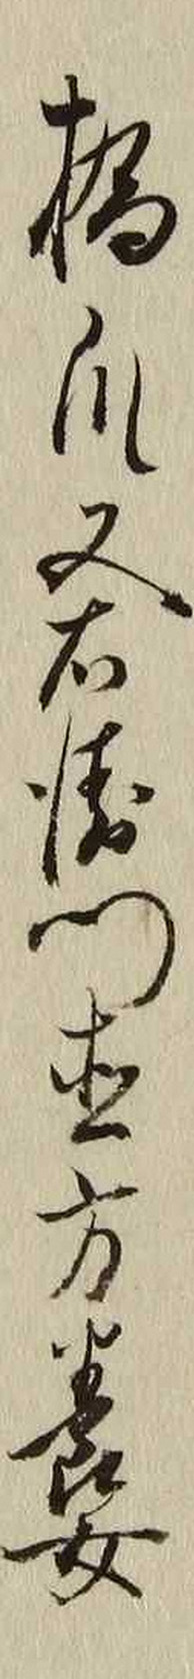女橋瓜又右衛門直方養女
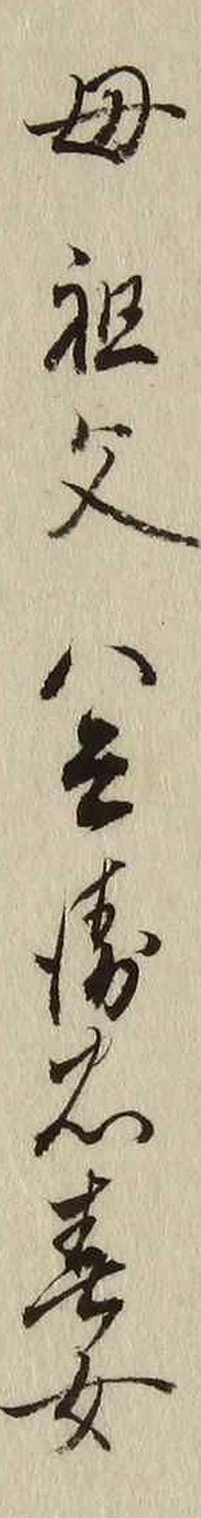母祖父八兵衛忠春女
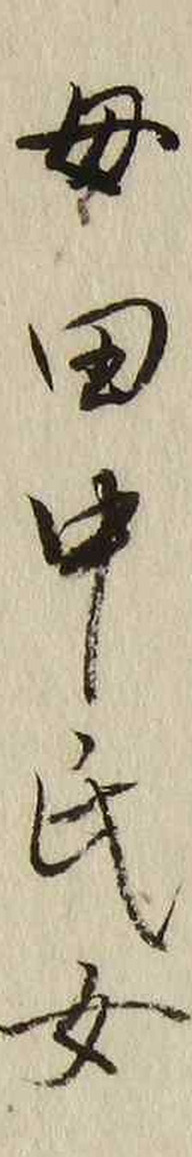母田中氏女

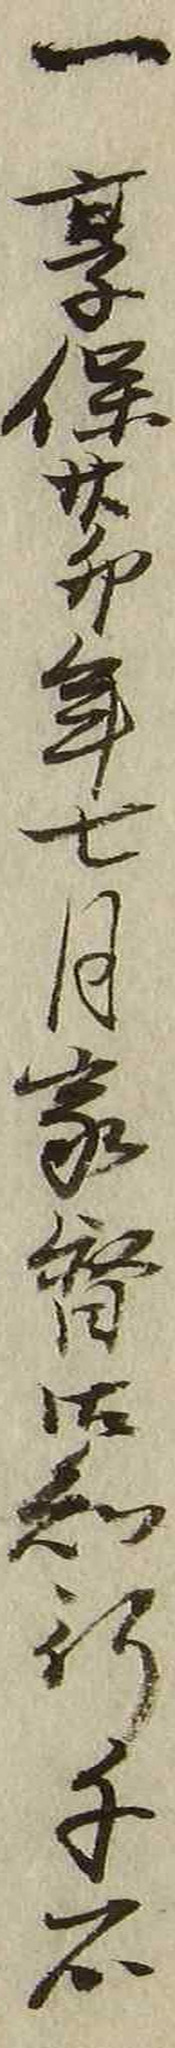一享保廿卯年七月家督御知行千石
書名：諸士系譜　巻之351　す之部1
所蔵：会津若松市立会津図書館
